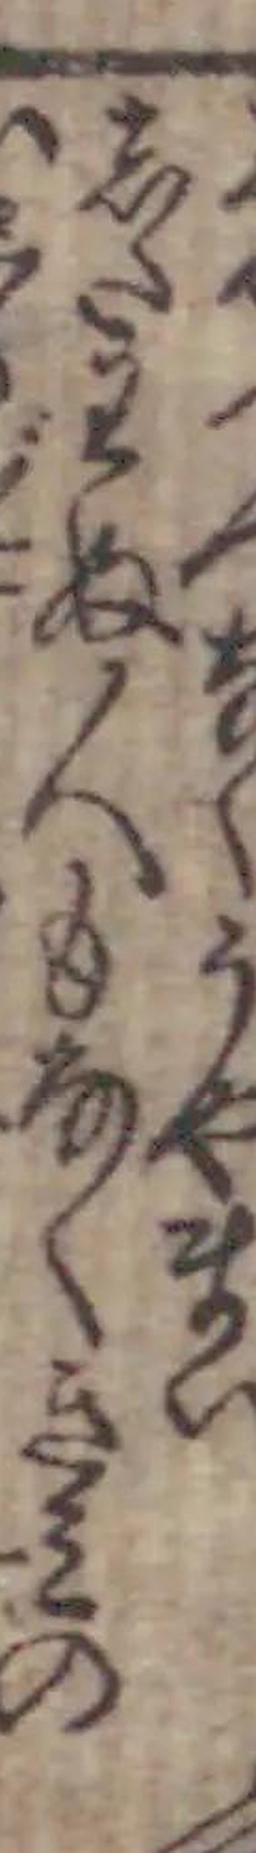したわぬ人もなくきみの
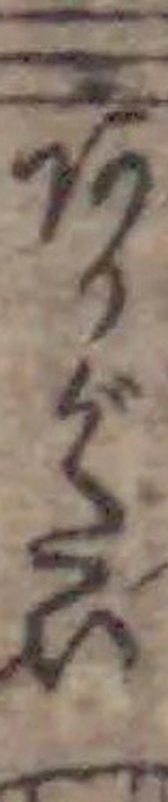ありがたい
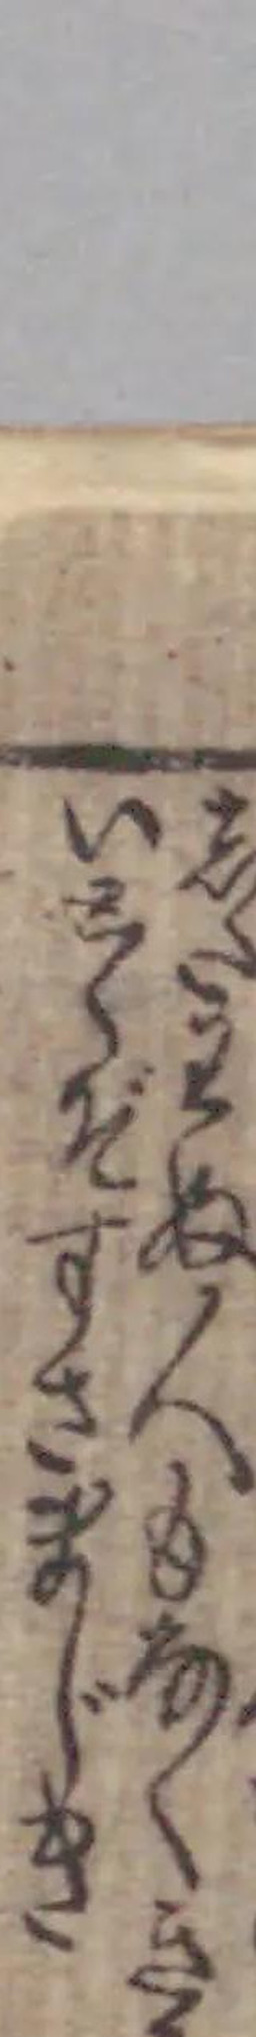いとくぞすさまじき
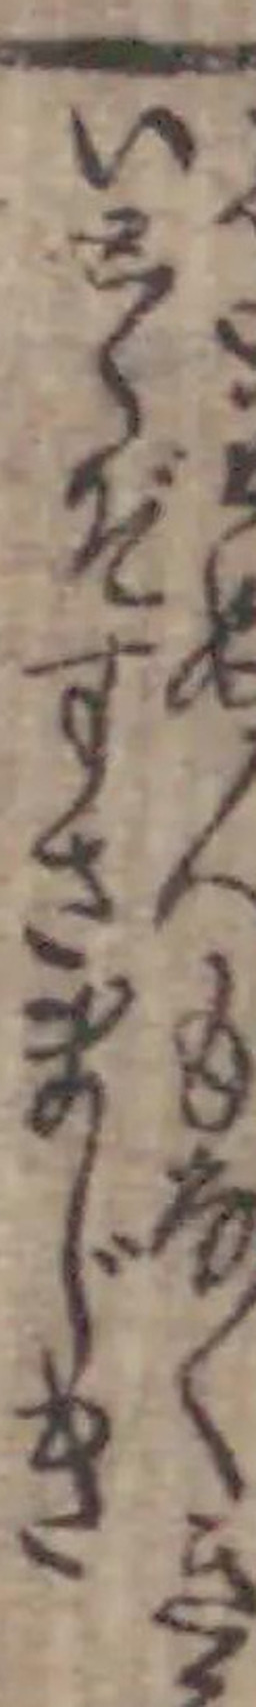いとくぞすさまじき
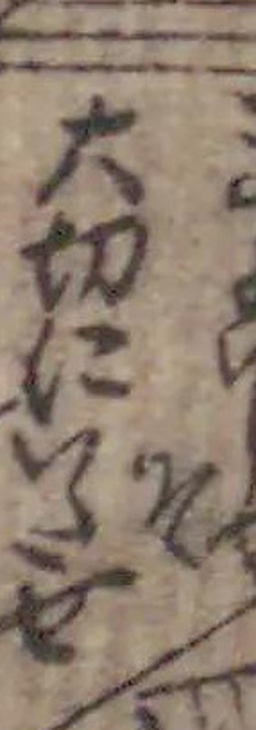大切にいたせ

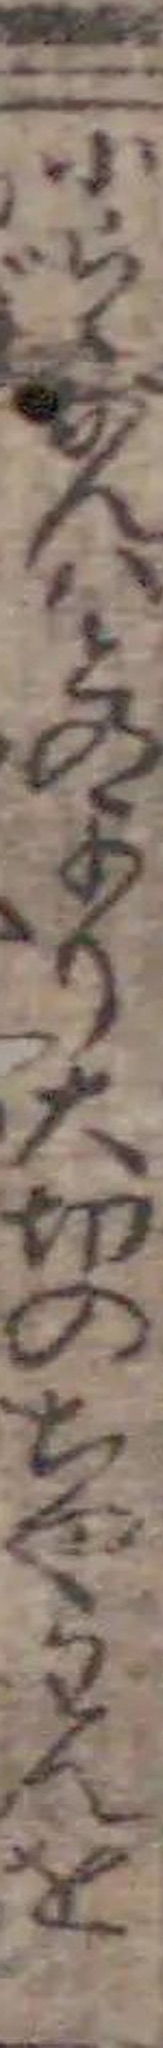小らくがんはとのより大切のちやわんを
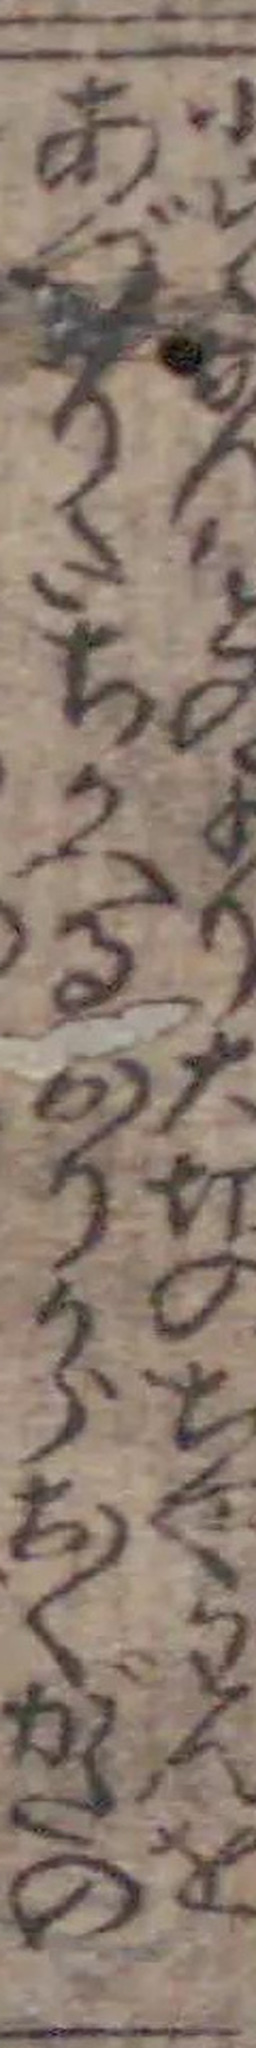あづかりたちかへるおりからおくがたの
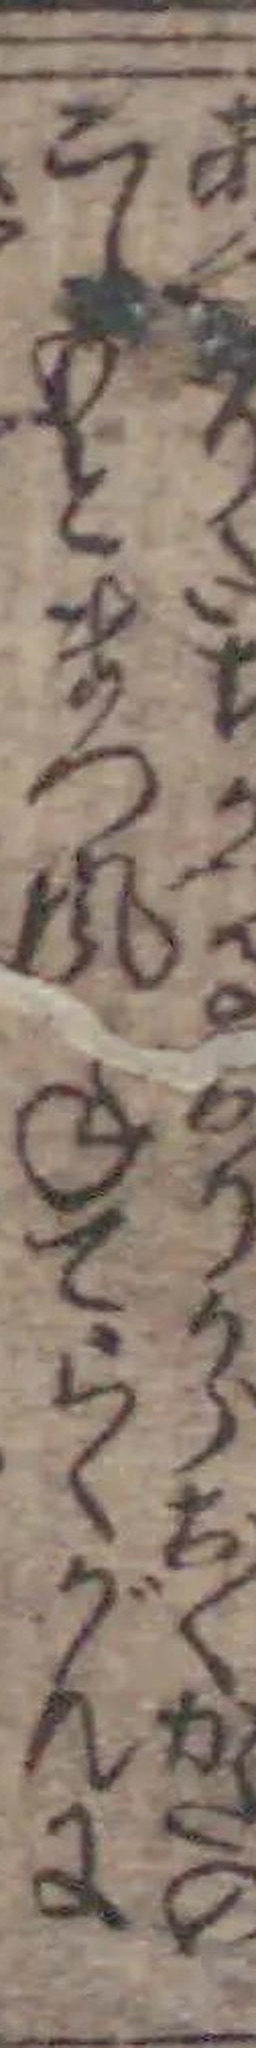こしもとまつ風ねてらくがんに
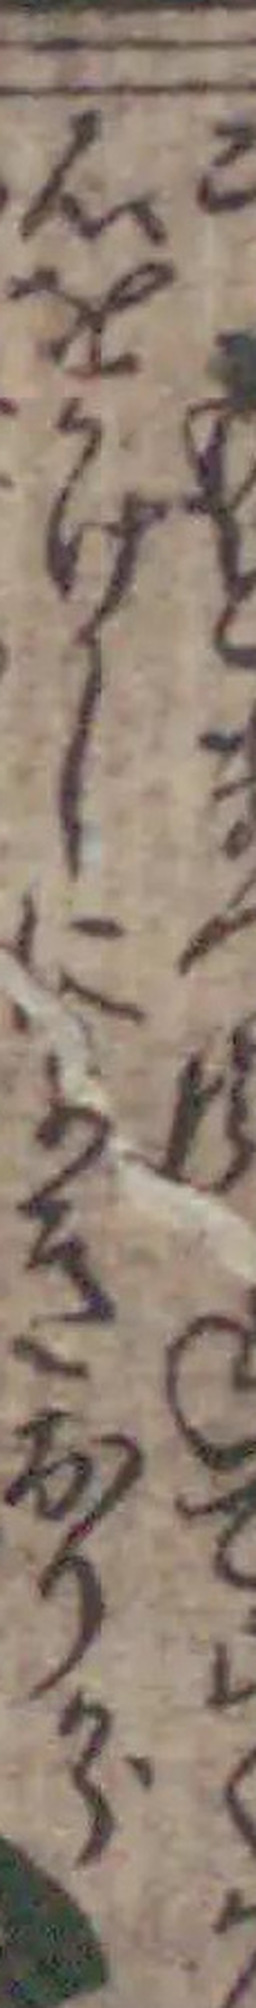心をかけしによきおりから
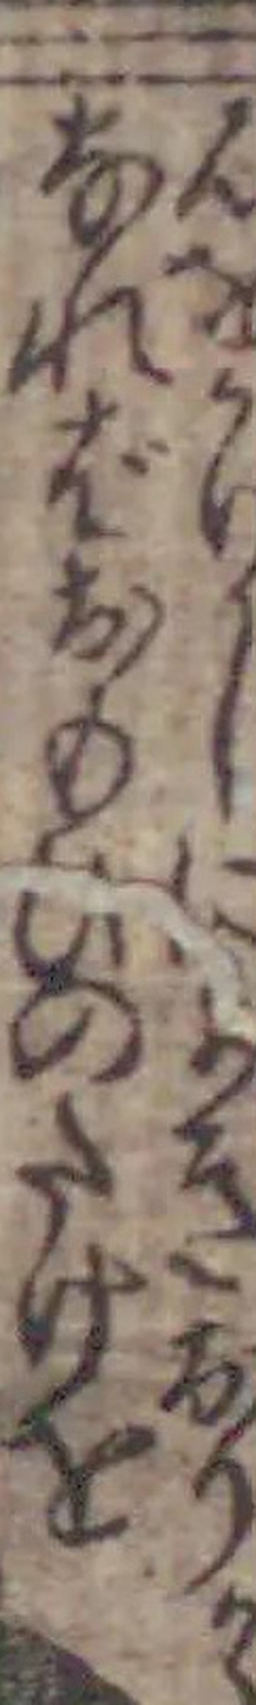なればおもひのたけを
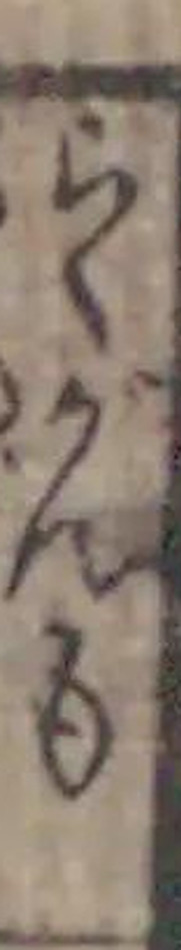らくがんも
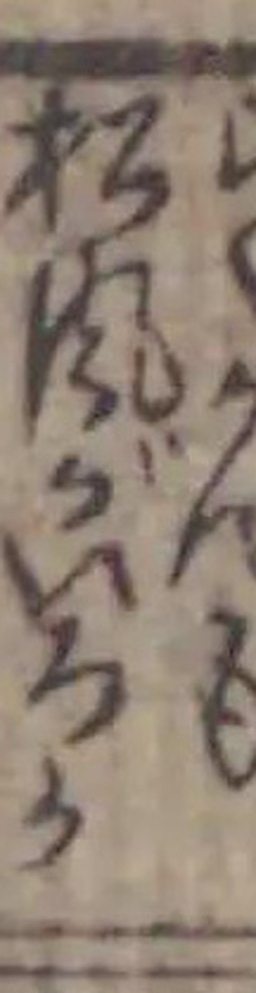松風がいろか
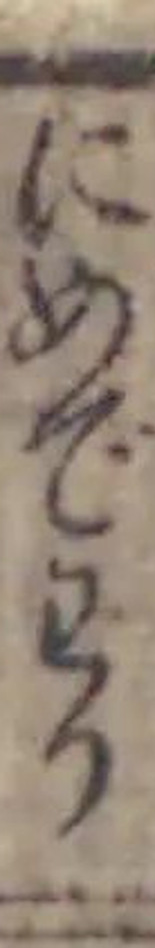にめでわり
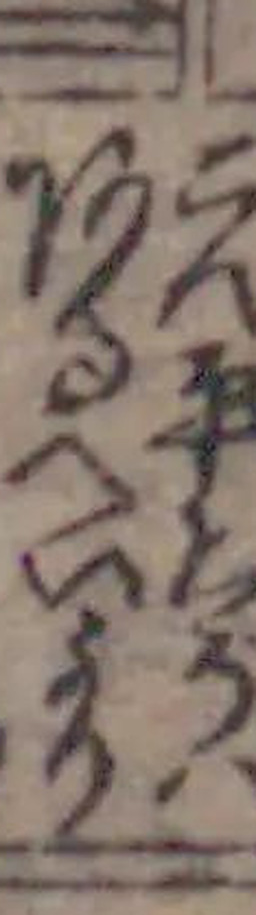あるへいより
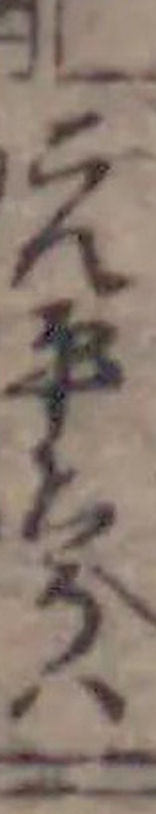こん平とうは
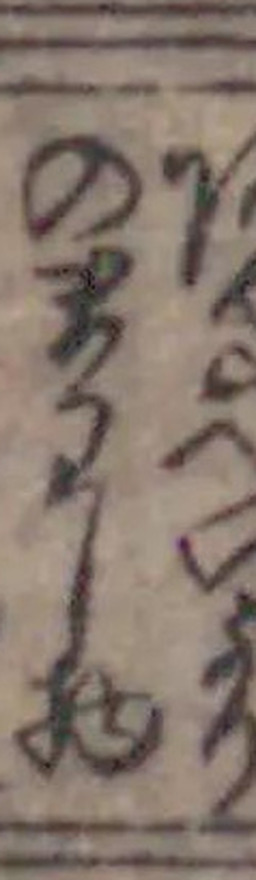のまわし物
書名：名代干菓子山殿 3巻
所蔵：国立国会図書館 National Diet Library, JAPAN
